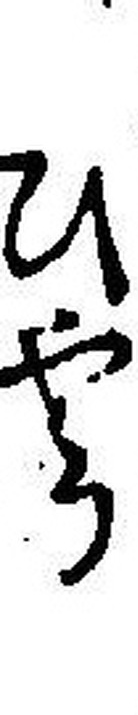ひやり
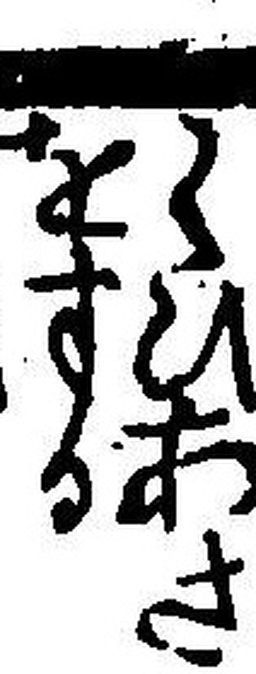をする
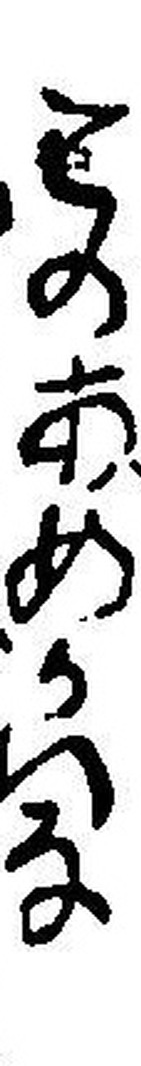このあめかいな
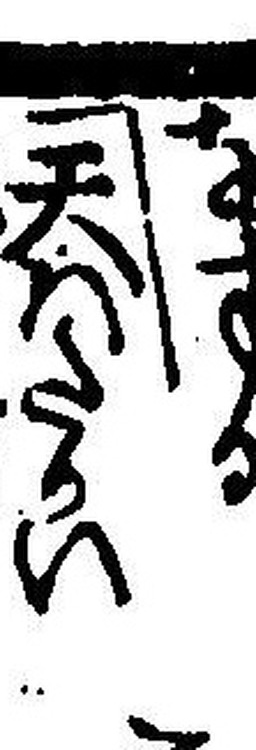〽天はたかい
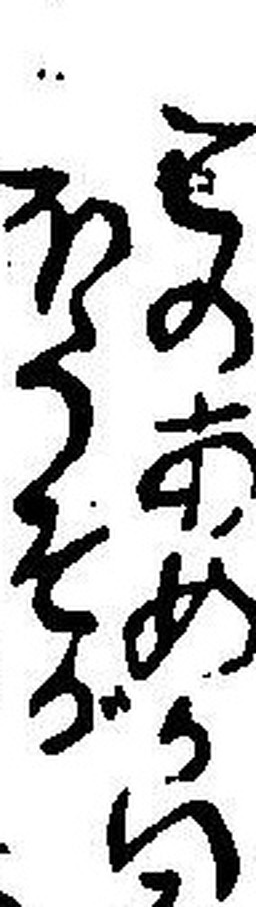ほうそが
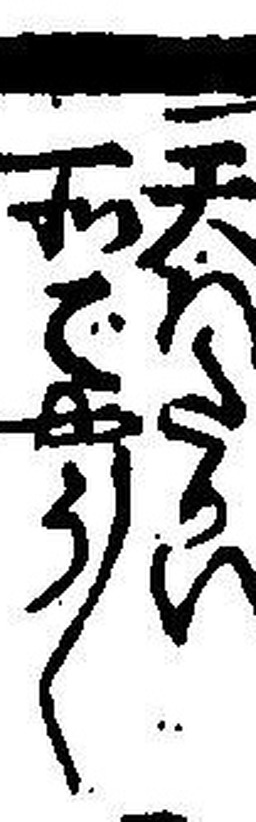所でやう〳〵
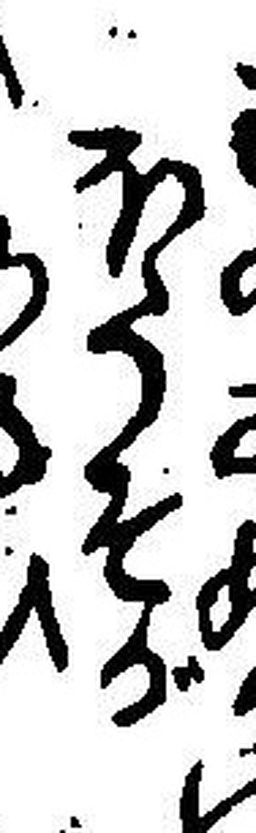かるひ
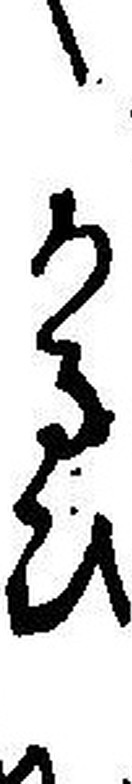かるひ
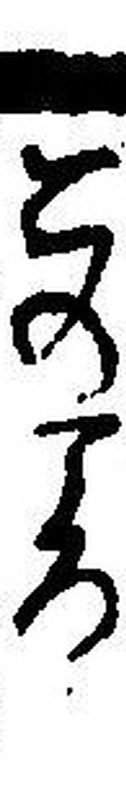このころ
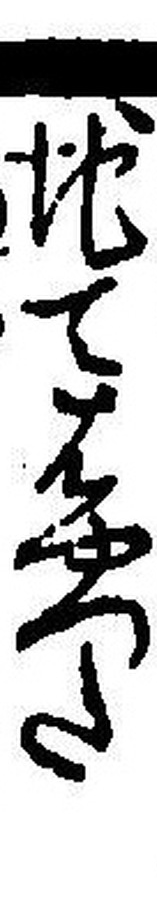地てはやつた
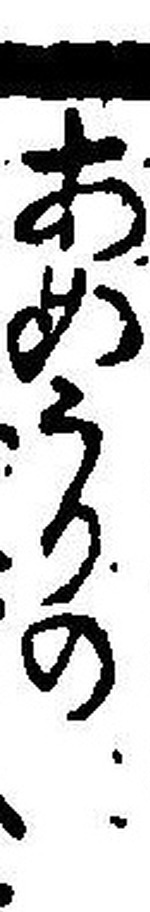あめうりの
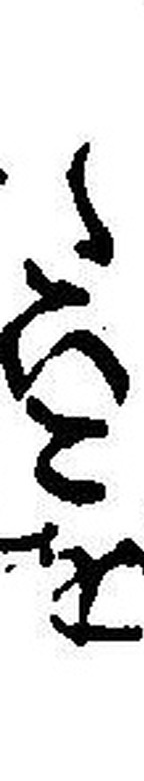たいこを
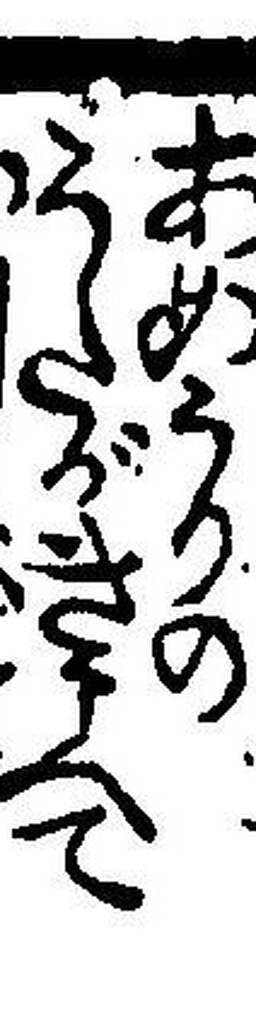うたがきこへて
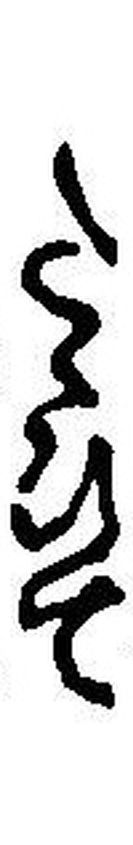たゝひて
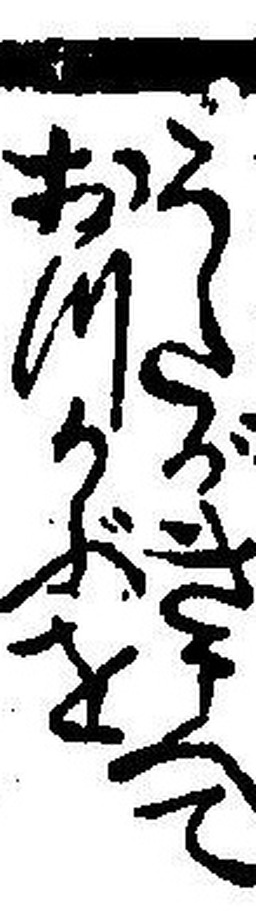おつかぶを
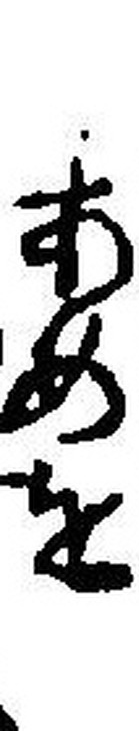あめを
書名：徳若水縁起金性 / 樹下石上作
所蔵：東京大学総合図書館 General Library in the University of Tokyo, JAPAN
